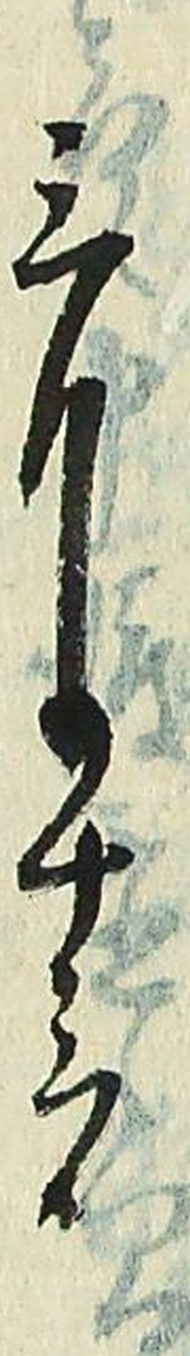三月十三日
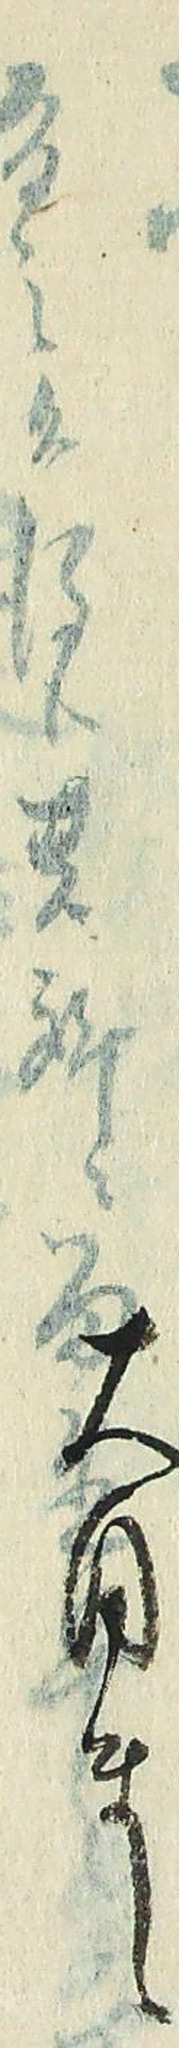大目付へ
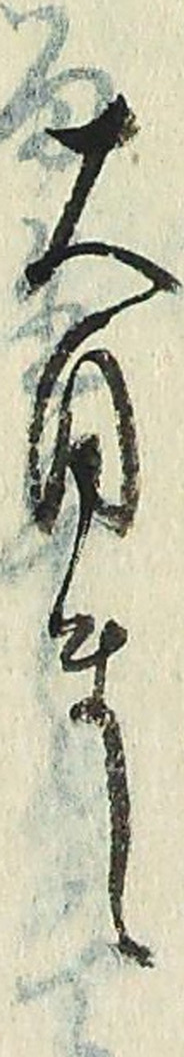大目付へ
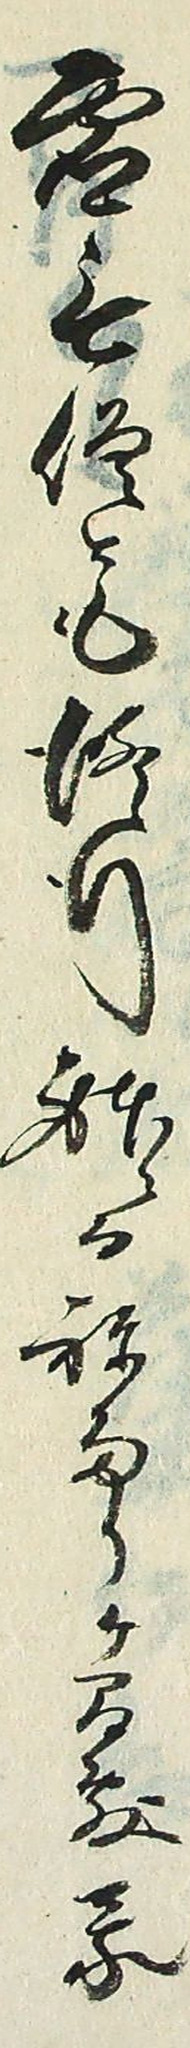虚無僧とも修行体に而ねたりケ間敷義
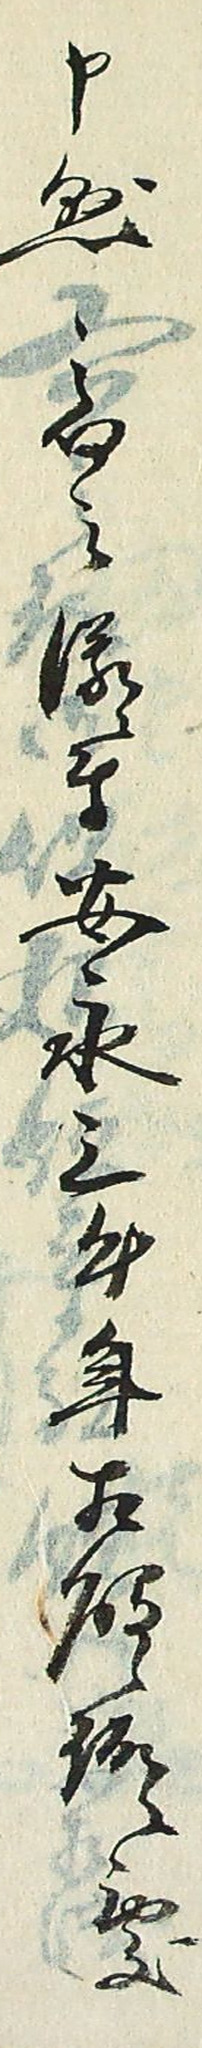申懸候者之儀に付安永三午年相触候趣に候処
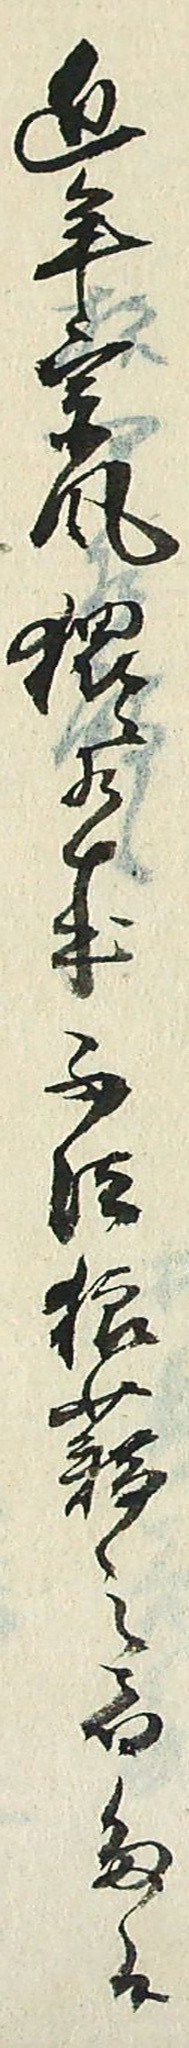近年宗風猥に相成不法狼藉之者多候
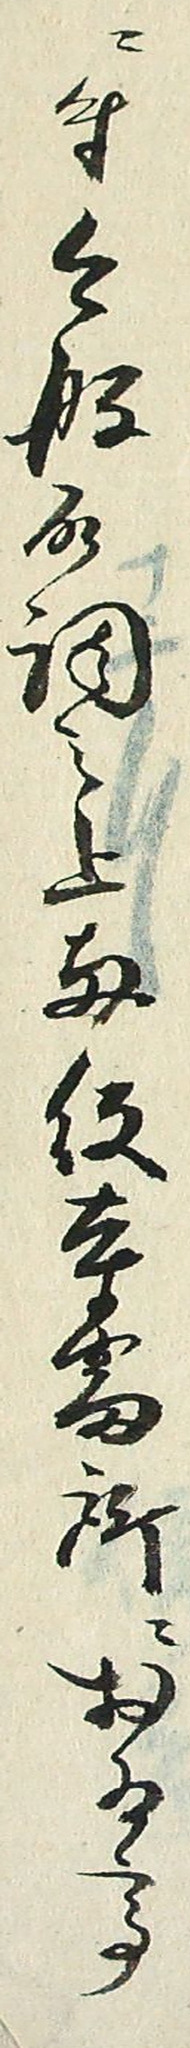に付今般取調之上両役寺番所におゐて

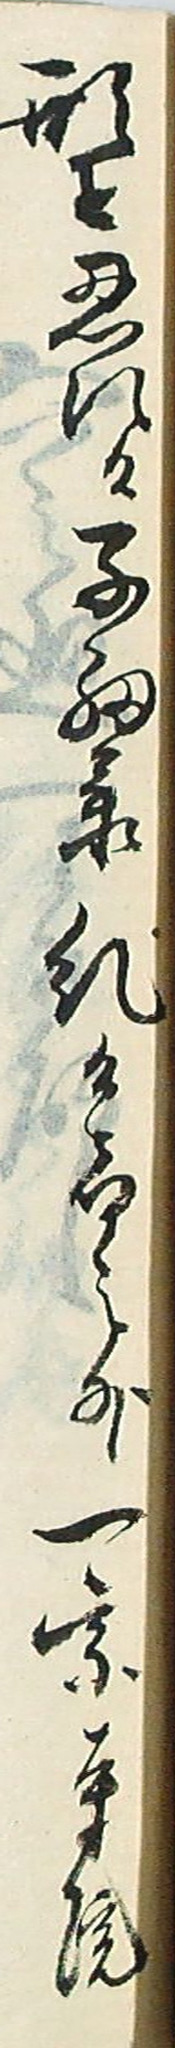形を忍ひ候子細承糺候者之外一宗寺院
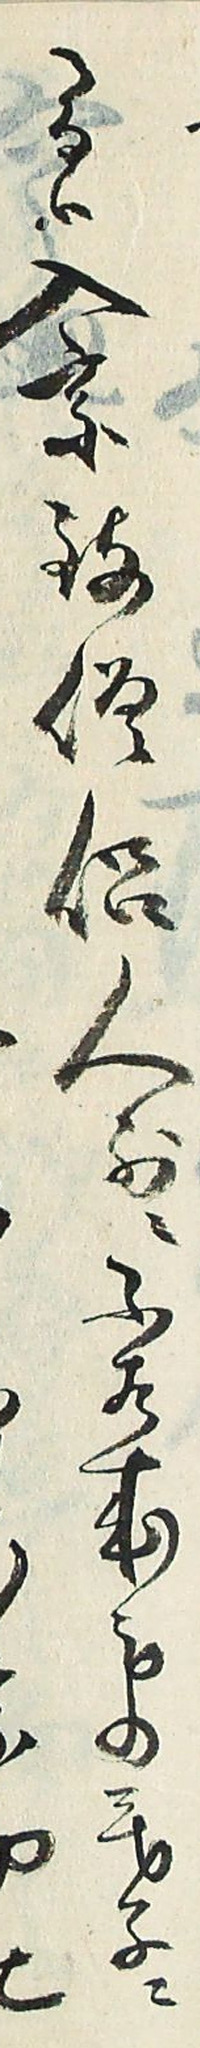に而は入宗致す僧侶人別に不相成もの弟子に
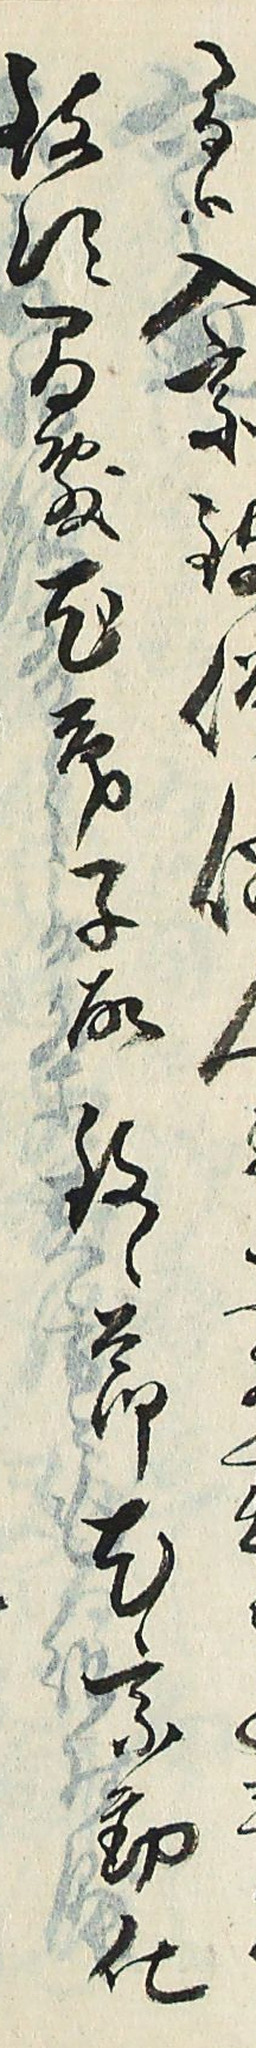致す間敷尤弟子取致候節尤宗勤仕
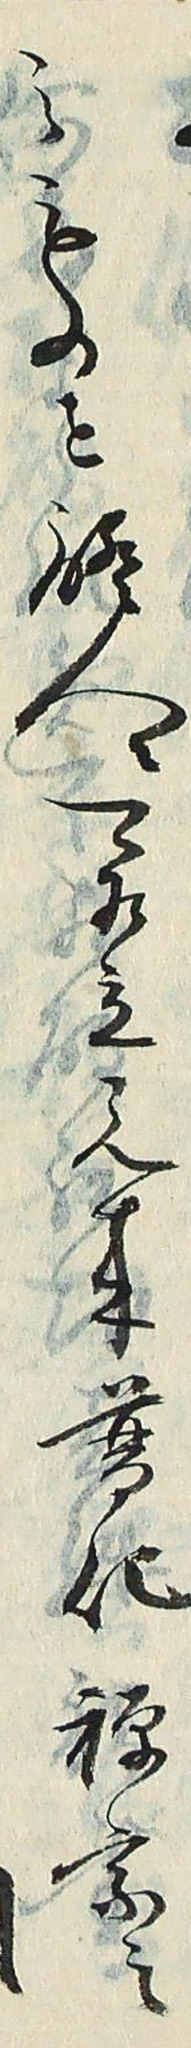之ものを證人に可相立元来普化禅宗の
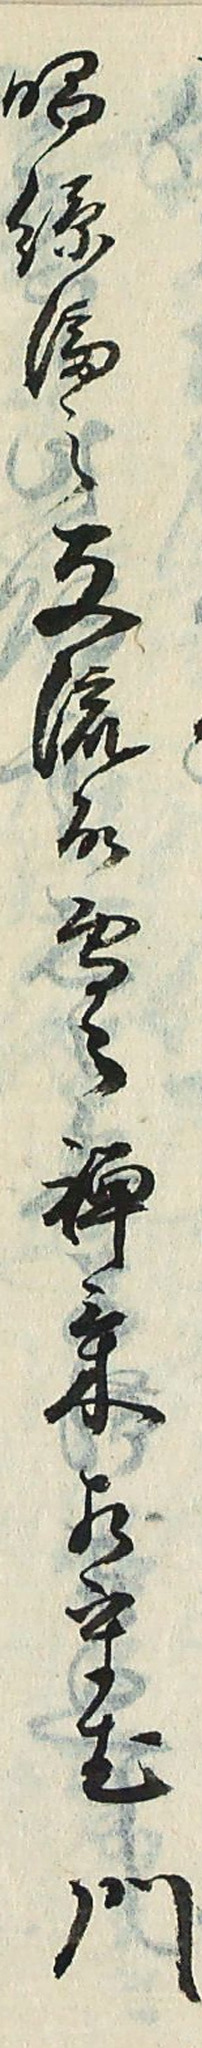唱臨済之支流故専ら禅気相守武門
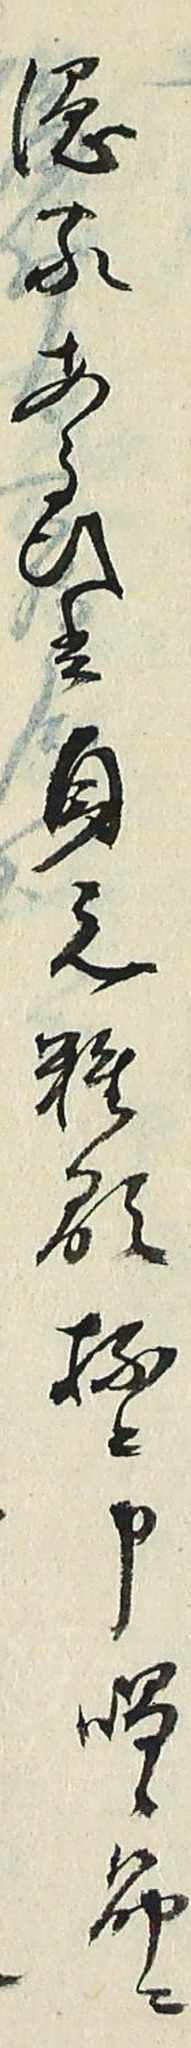隠家あるひは身元難顕抔と申唱候筋に
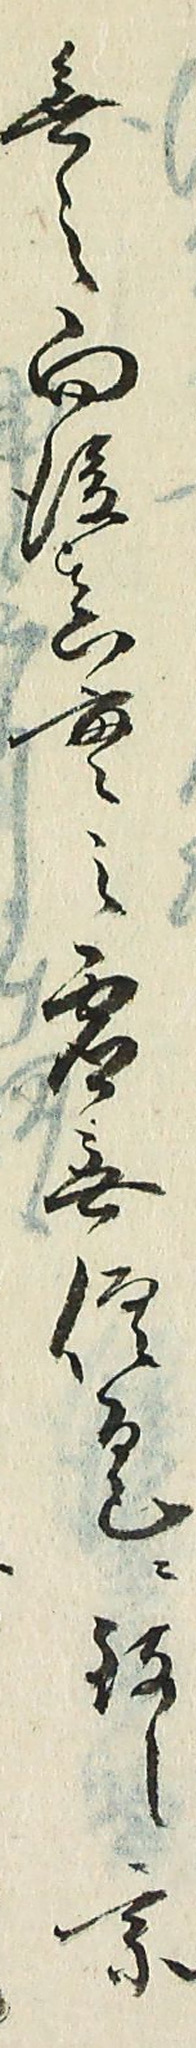無之向後真実の虚無僧而已に致し宗
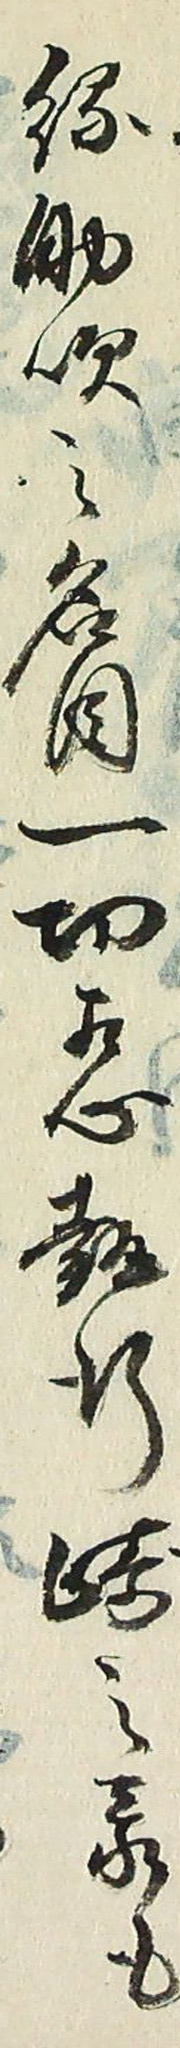縁助吹之名目一切相止執行崎之義も
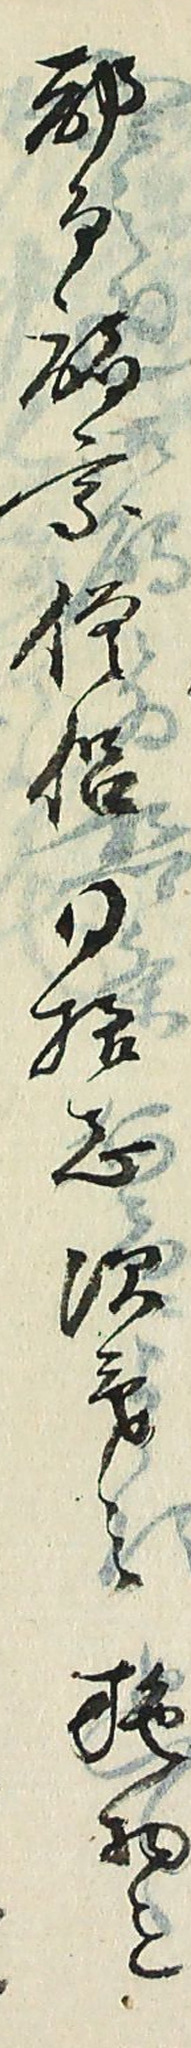都而諸宗僧侶同様志次第の施物を
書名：諸御用御□受書控
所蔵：鳴門教育大学 Naruto University of Education
